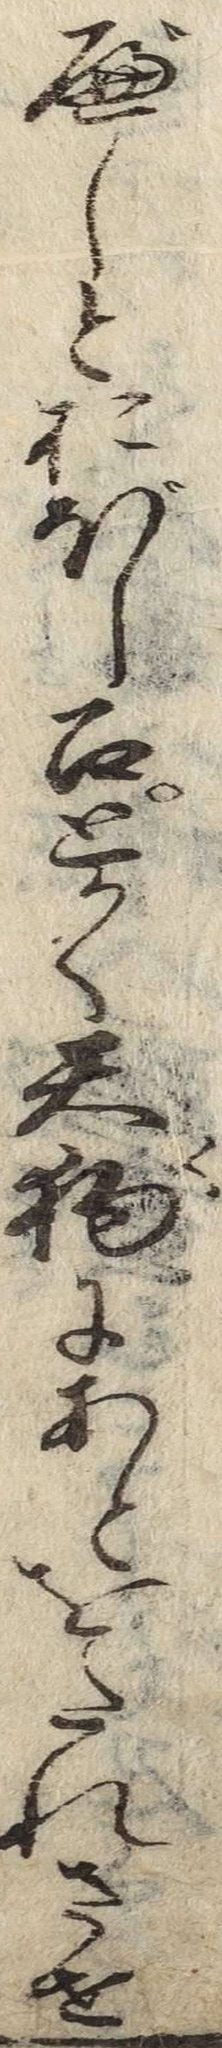べしとおぼし召。とかく天狗にあとをたれさせ
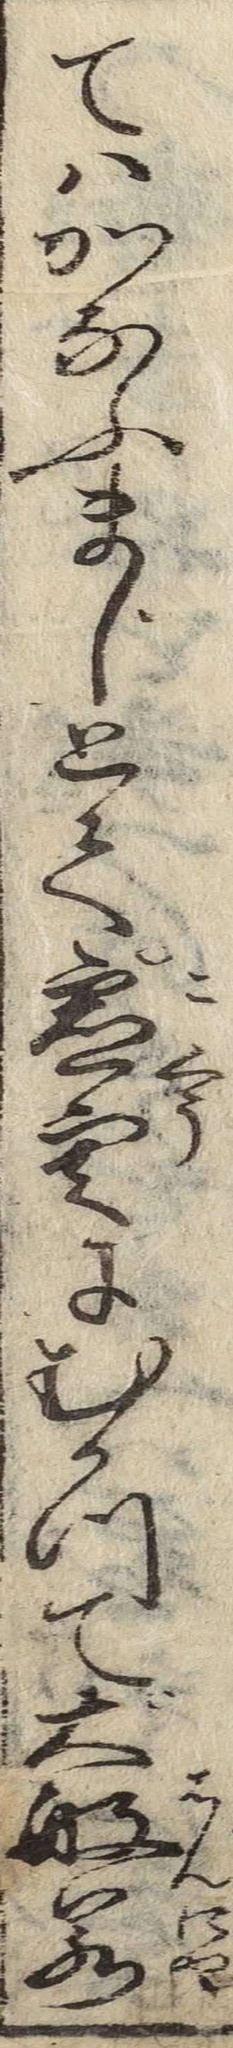てはかなふましとて。虚空にむかつて大般若

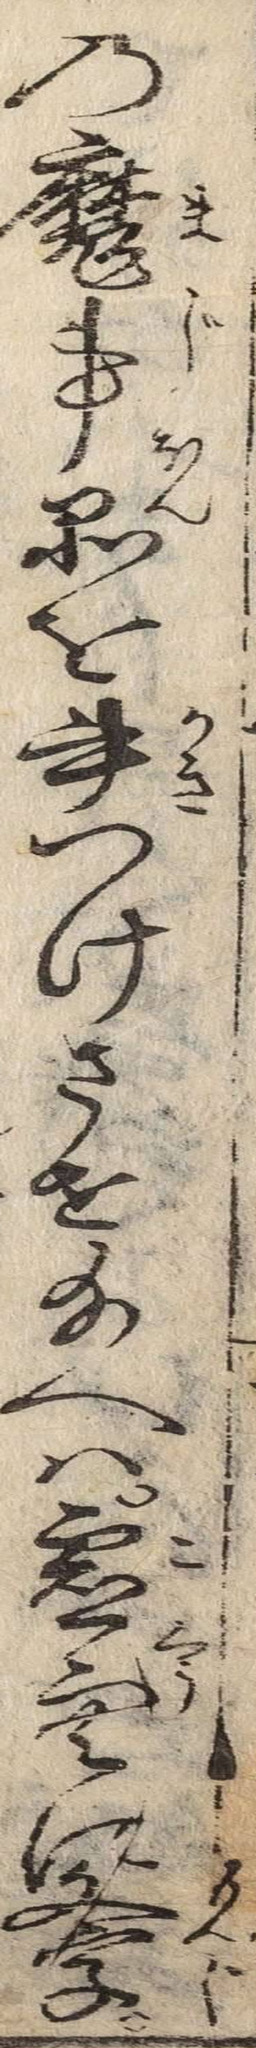の魔事品を書つけさせ給へは。虚空に文字
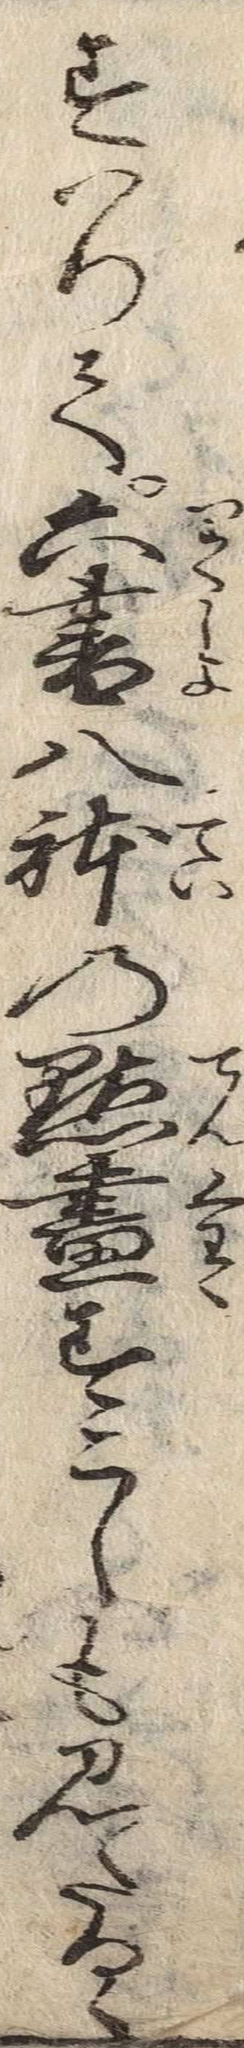すはりて。六書八体の点画すこしもみたるゝ
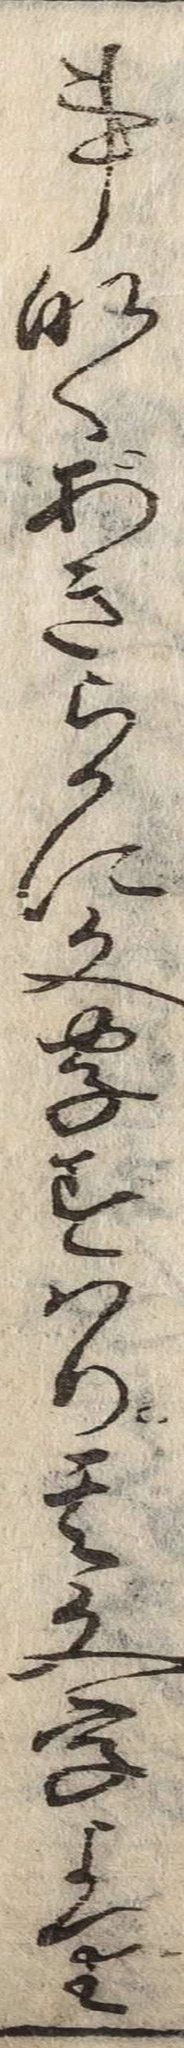事なく。あきらかに文字すはり。其文字より
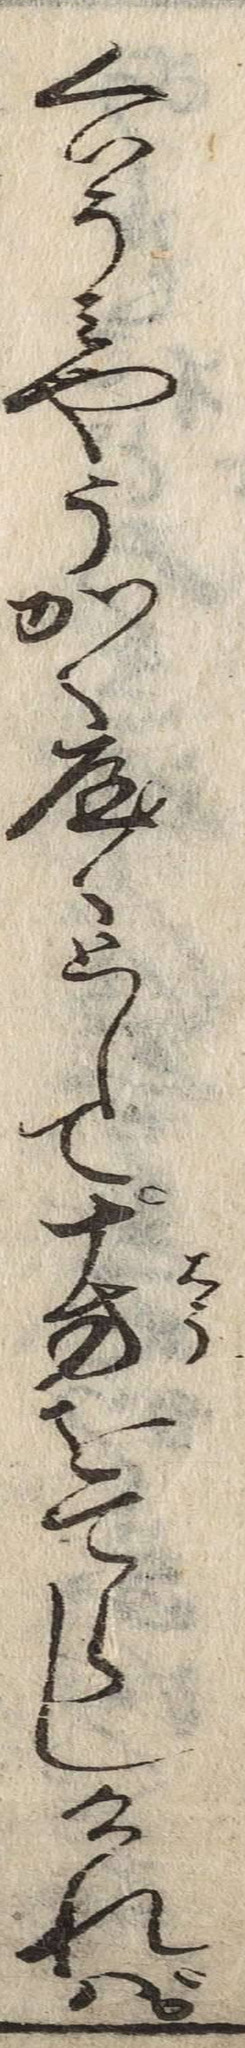くはうみやうかくやくとして。十方をてらしければ。
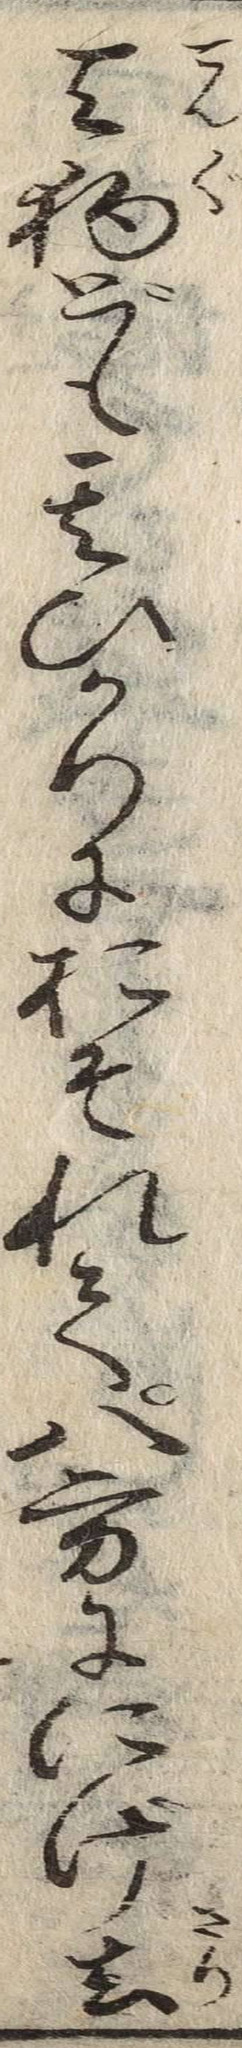天狗ども其ひかりにおそれて。八方ににげ去
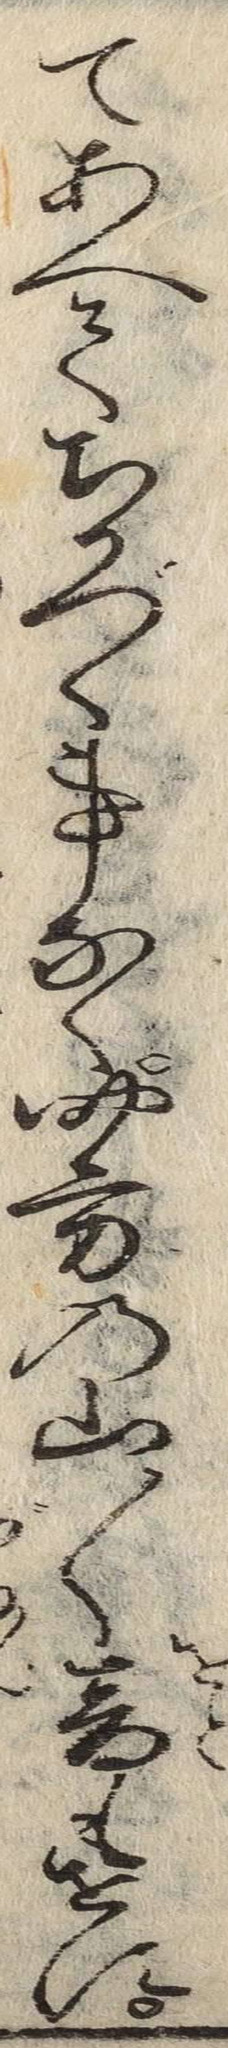あへてちかづく事なく。四方の山〳〵音もせす。
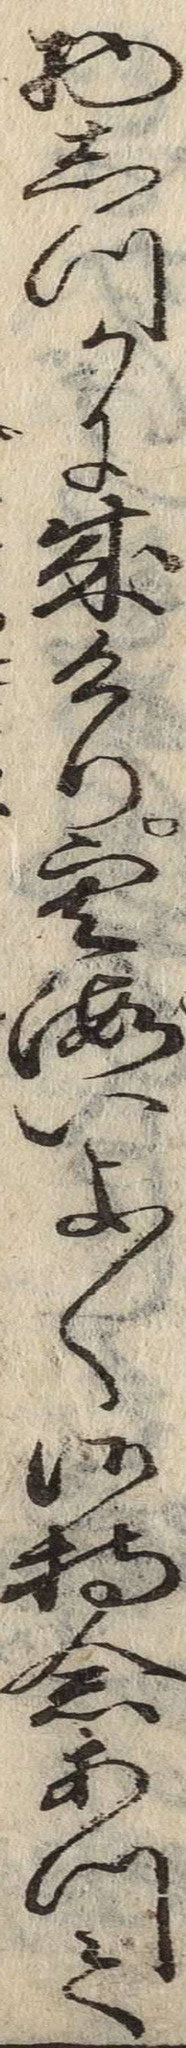物しつかに成けり。空海いよ〳〵御持念あつて
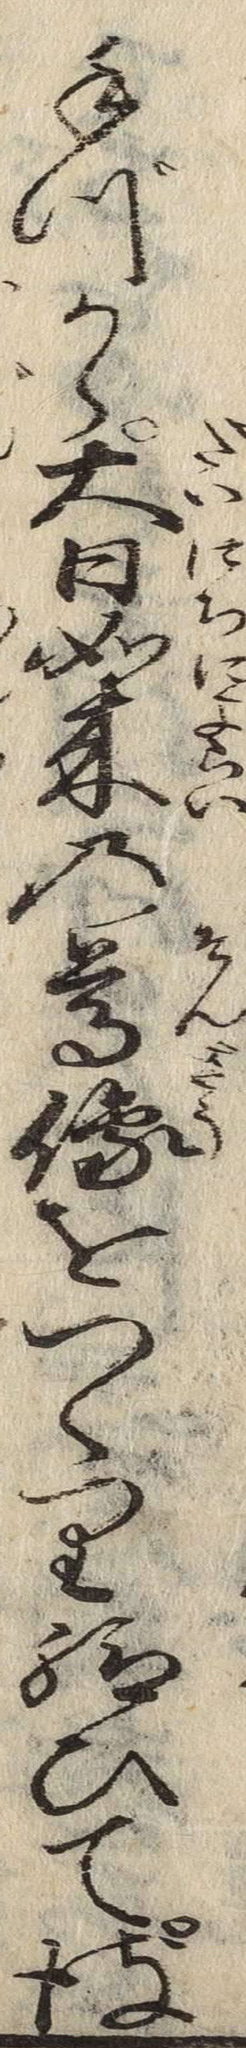てづから。大日如来の尊像をつくり給ひて。彼
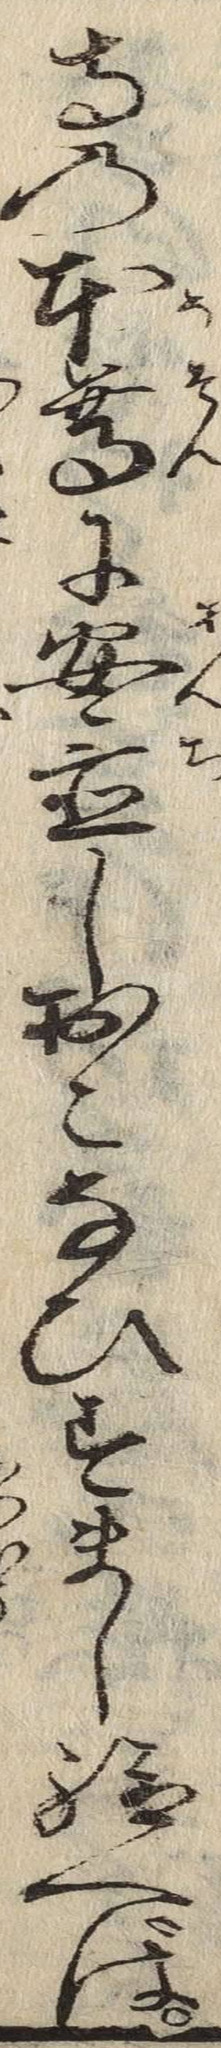寺の本尊に安置しおこなひすまし給へば。
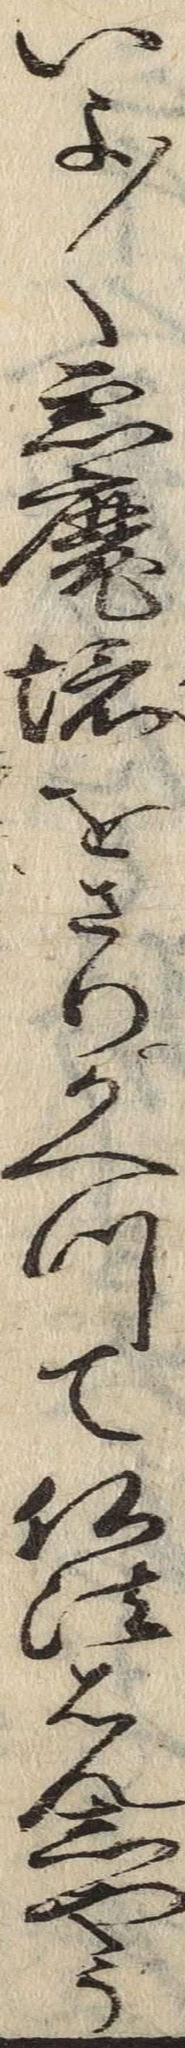いよ〳〵悪魔境をさり。かへつて仏法はんじやう
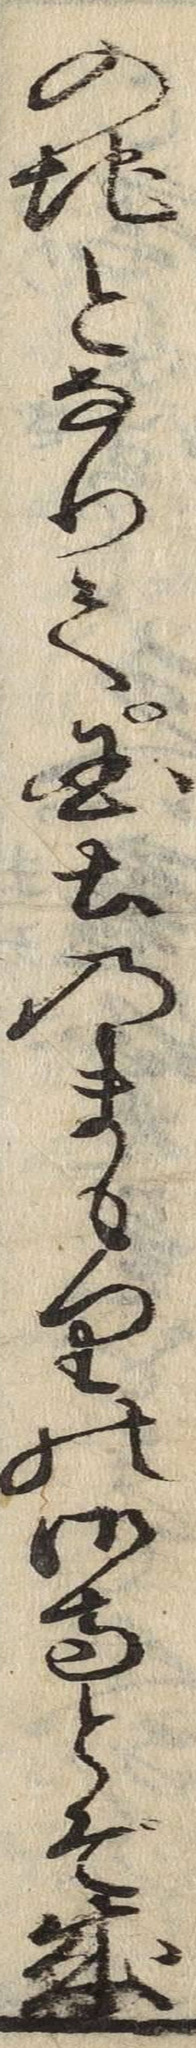の地となりて。国土のまもりの御寺とぞ成
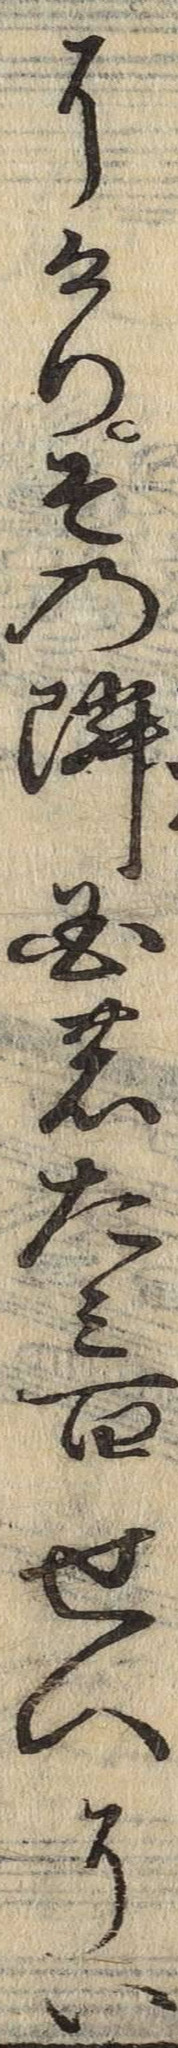にけり。その隣国のたみ百せいにい
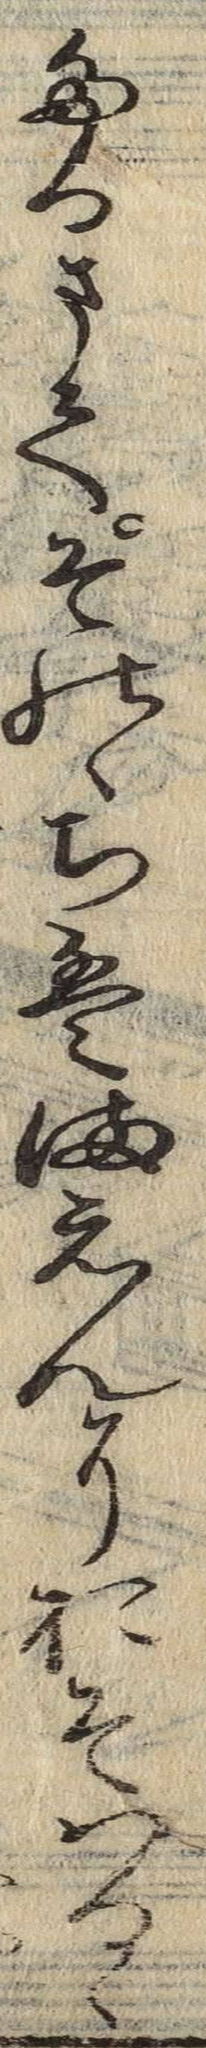たるまて。そのゝちはまえんにおそはるゝ
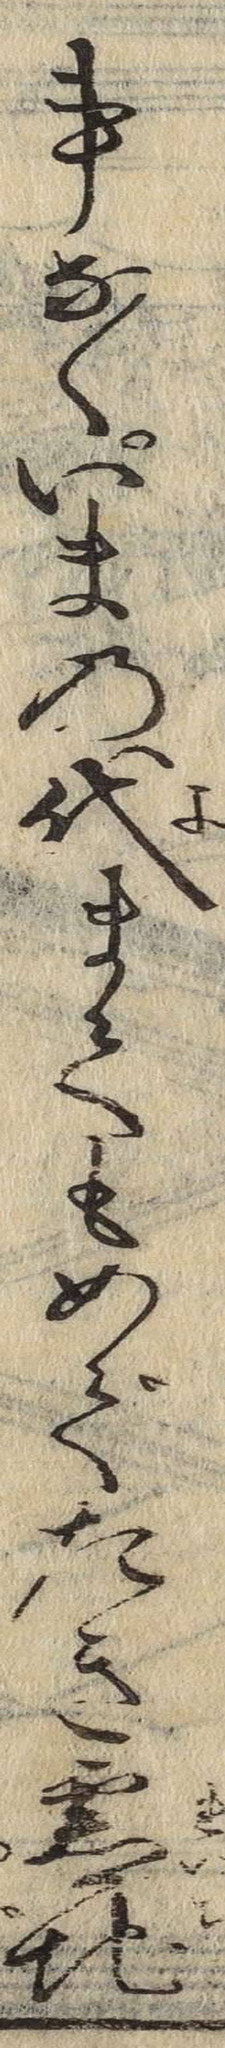事なく。いまの代まてもめでたき霊地
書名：弘法大師御傳記
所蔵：京都府立京都学・歴彩館 国文学研究資料館
